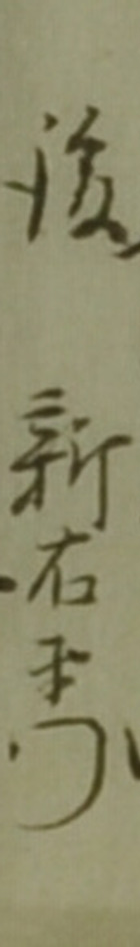後新右衛門
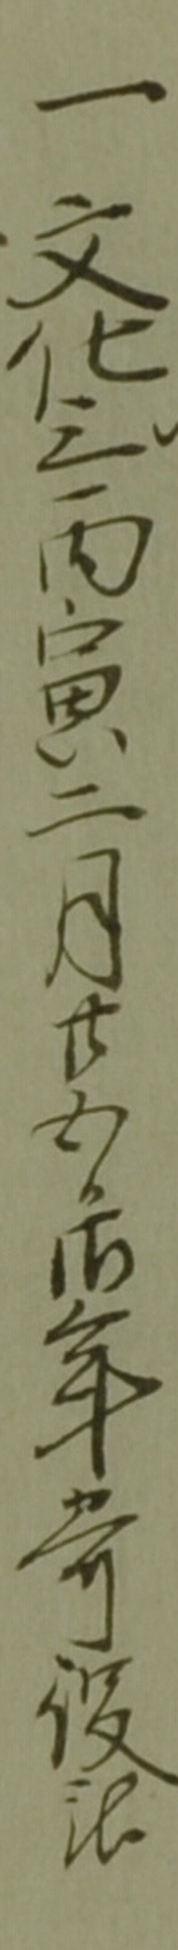一文化三丙寅二月廿五日御年寄役被
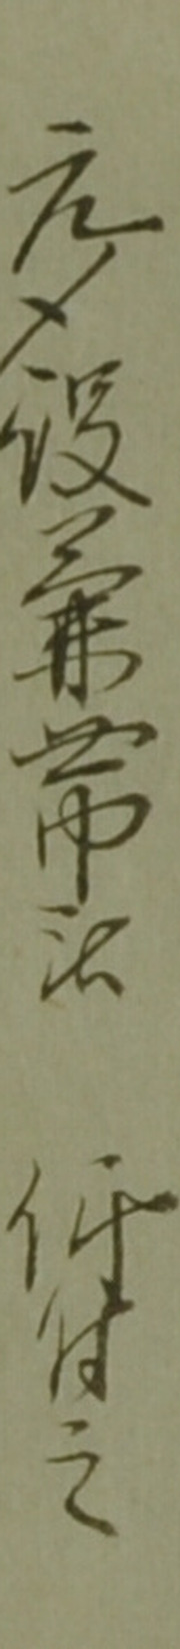元〆役兼帯被仰付之
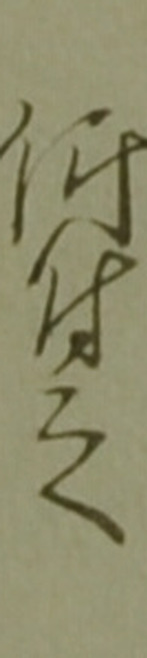仰付之
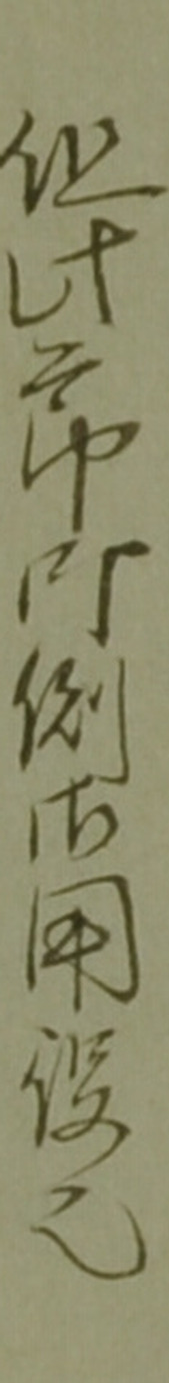但此節御側御用役也
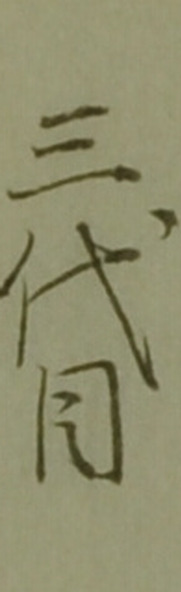三代目
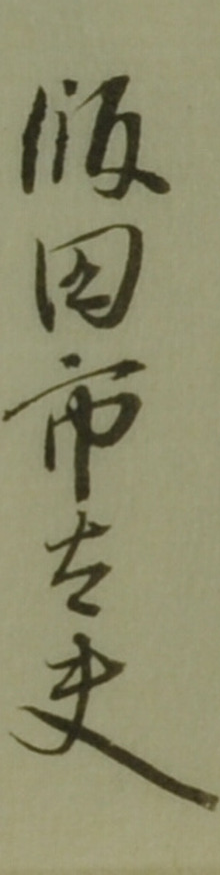飯田市太夫
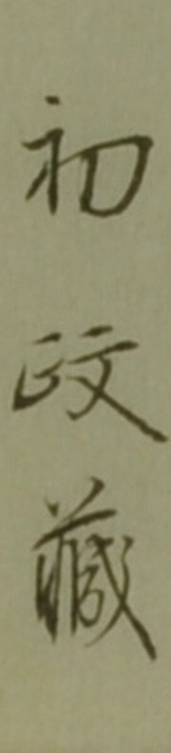初政蔵
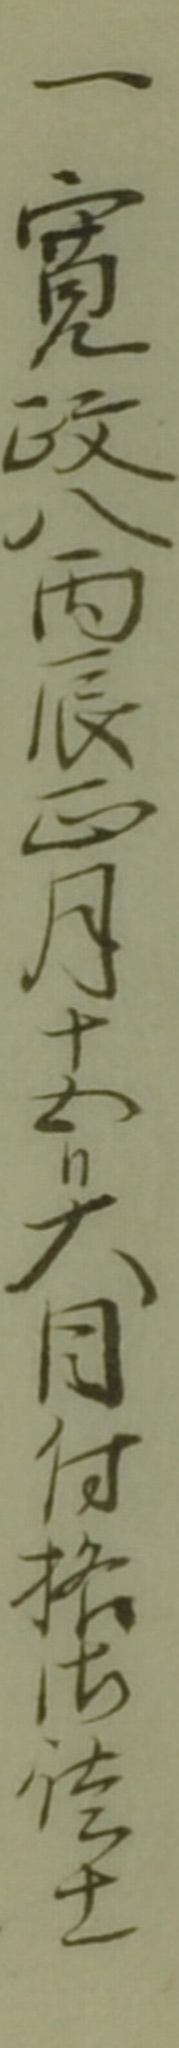一寛政八丙辰正月十五日大目付格御徒士
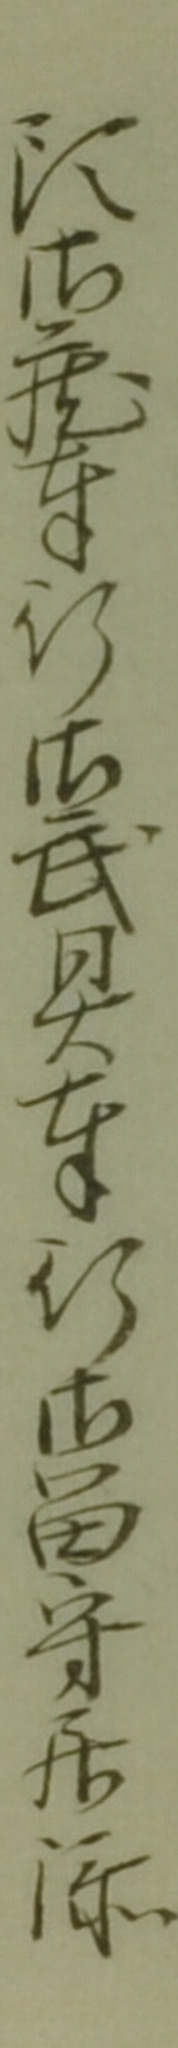頭御蔵奉行御武具奉行御留守居添
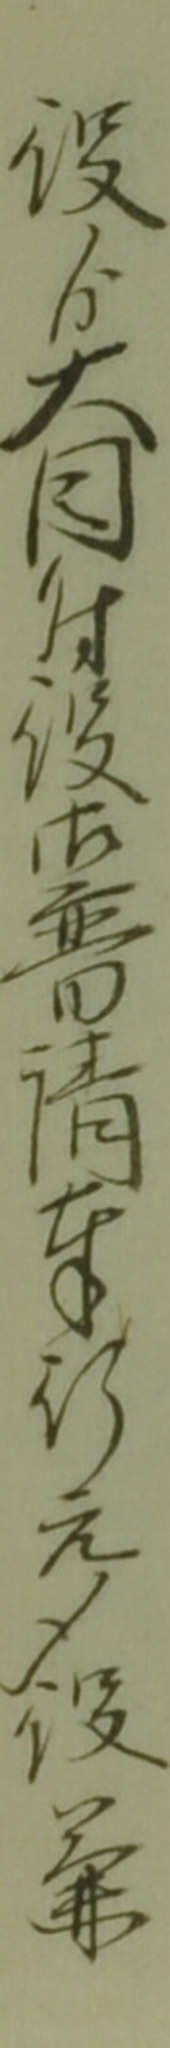役ゟ大目付役御普請奉行元〆役兼
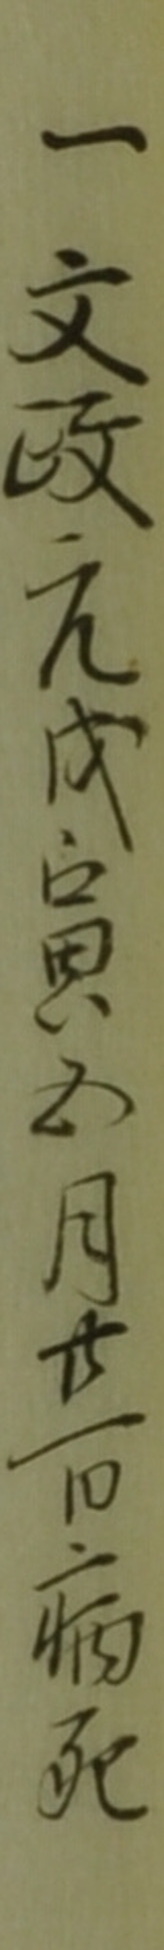一文政元戊寅五月廿一日病死
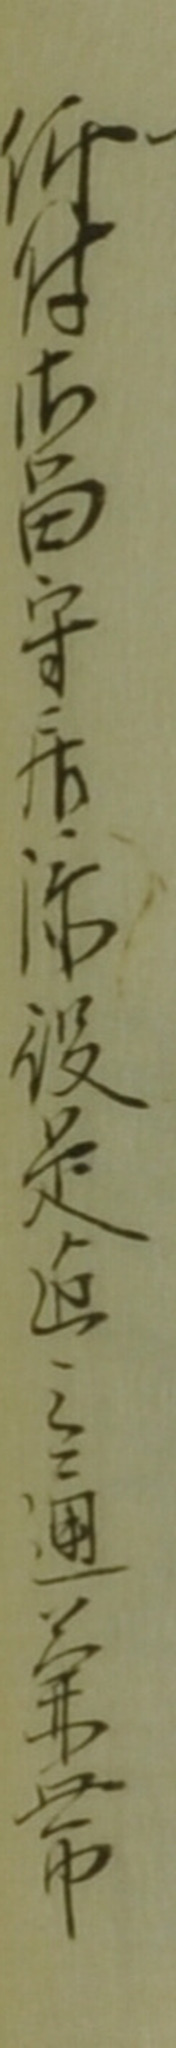仰付御留守居添役是迄之通兼帯
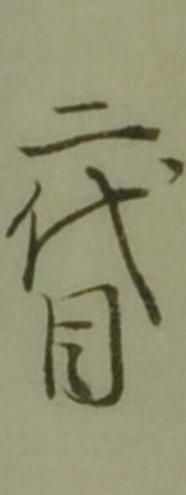二代目
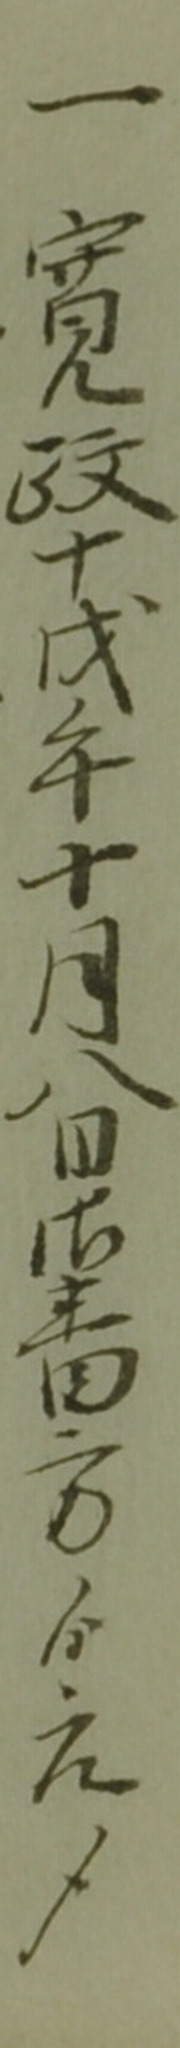一寛政十戊午十月八日御番方ゟ元〆
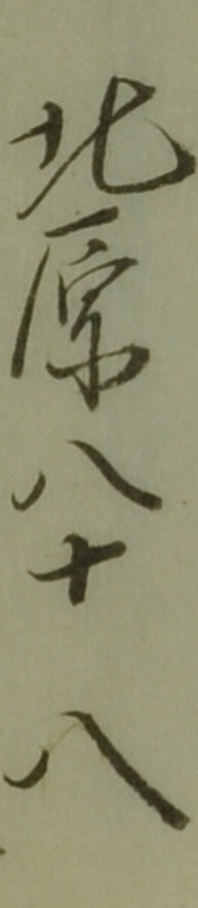北原八十八
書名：諸御役代々録（七）
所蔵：伊那市立高遠町図書館・合同会社AMANE
